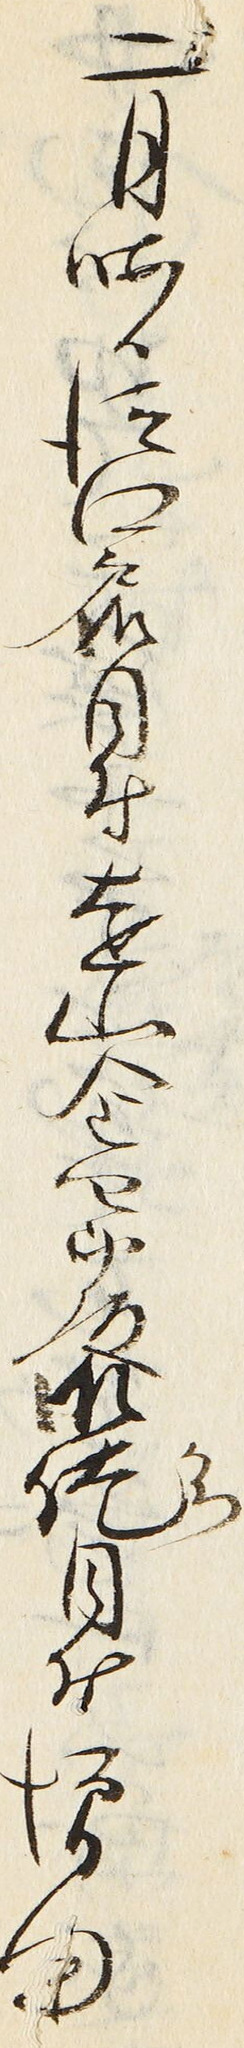二月晦日後江府目付遠山金四郎殿御徒目付増田
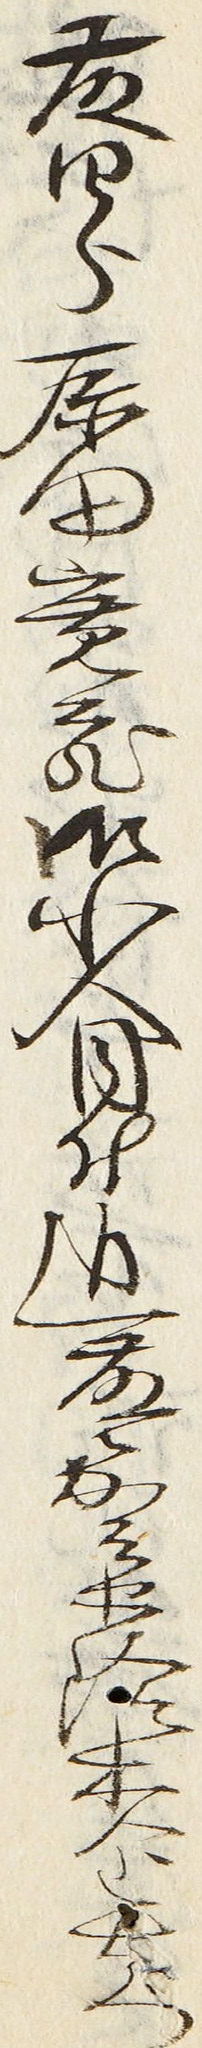藤四郎原田寛蔵御小人目付近藤嘉兵衛鈴木金右衛門
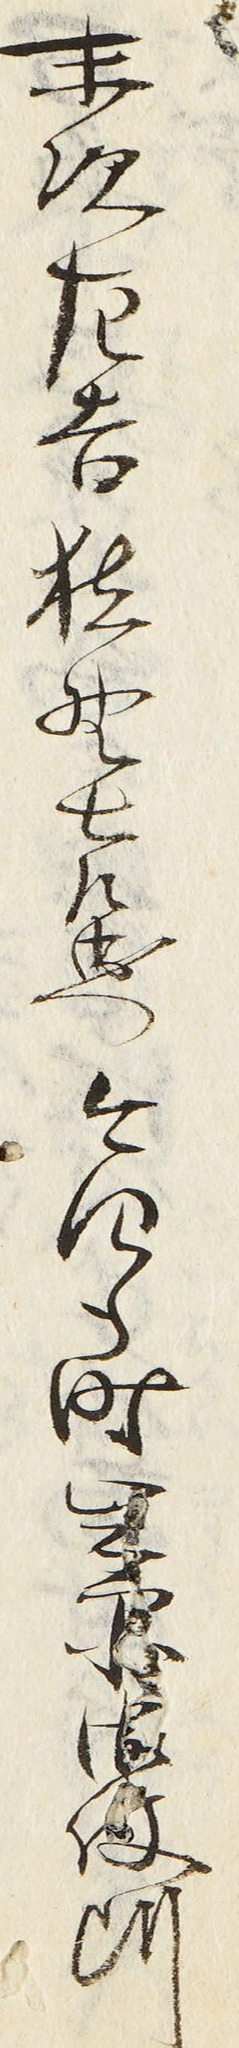末次左吉猪野七左衛門今四ッ時岩原御役所
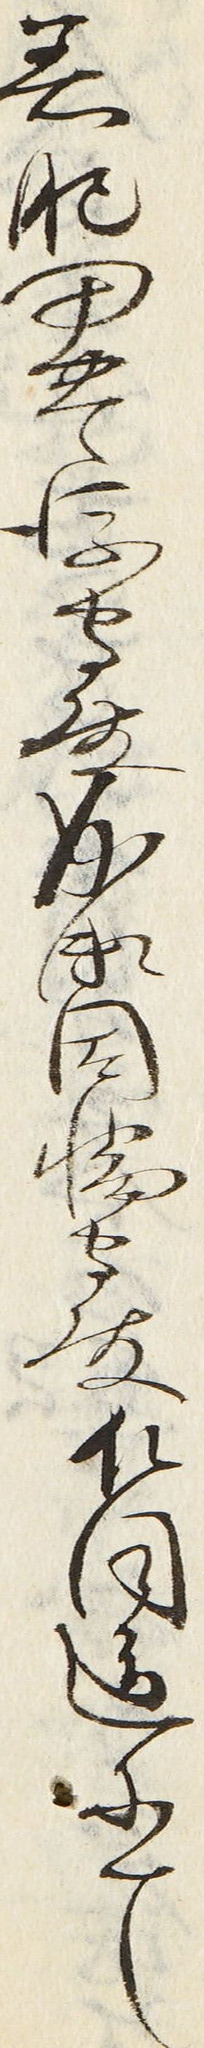着肥田豊後守殿成瀬因幡守殿御同道にて
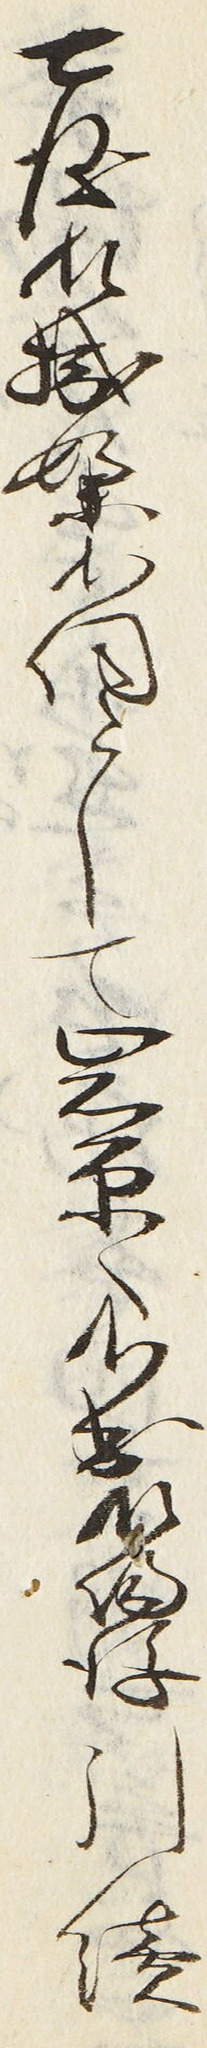公儀相機嫌御伺として岩原へ御出御帰後引続
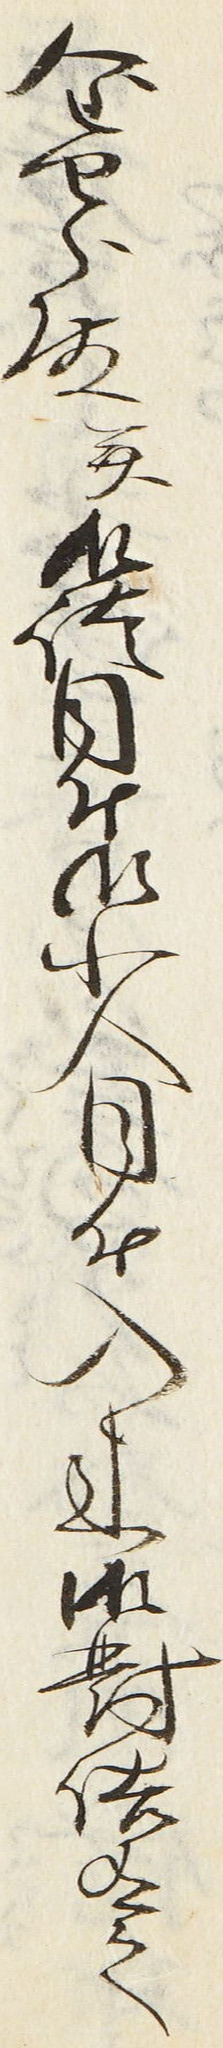金四郎殿幷御徒目付御小人目付入来御対話有之
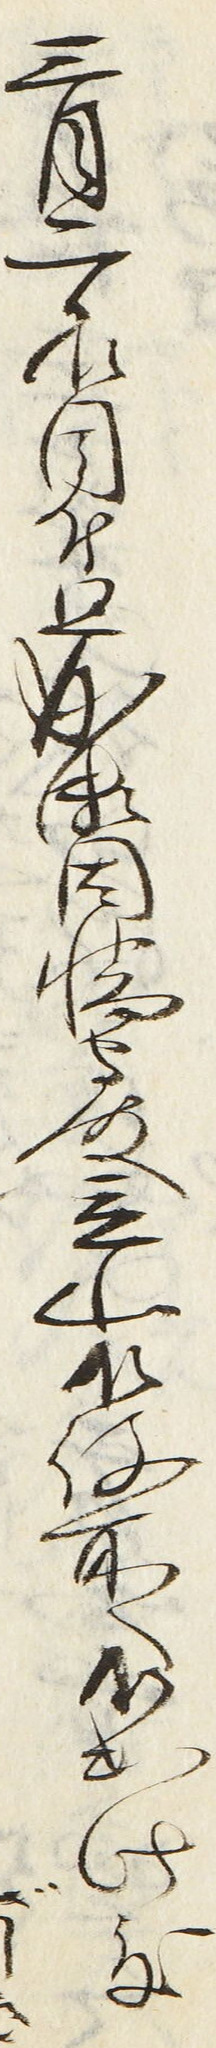三月二日御目付且成瀬因幡守殿立山御役所へ御出此度
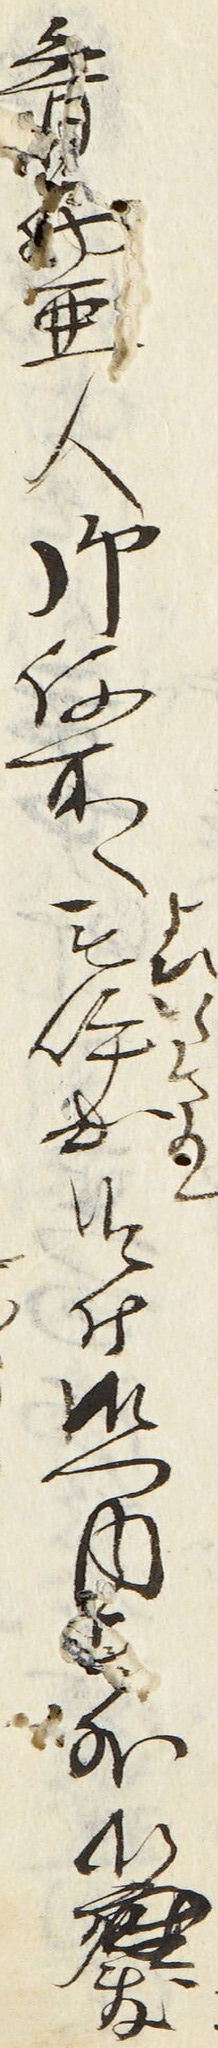魯西亜人御役所へ被呼出候に付御門内其外御座敷
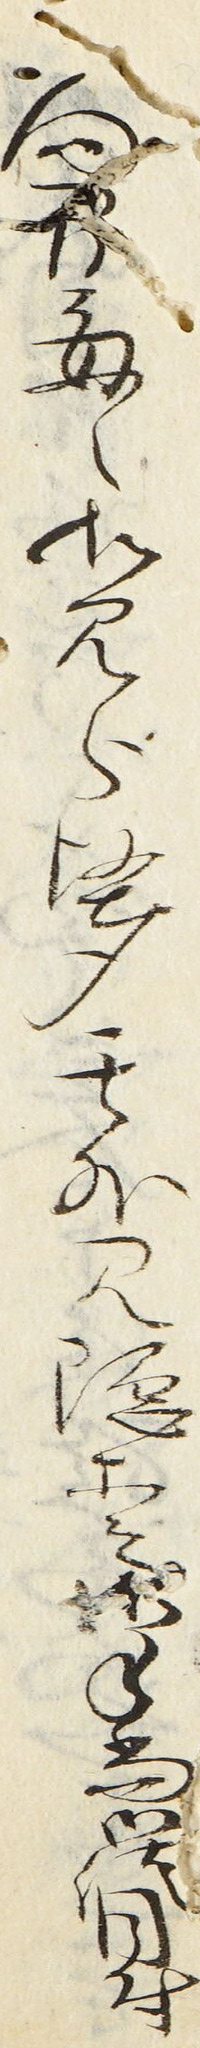向間毎之御見分堅め其外見隠等之御手当御徒目付

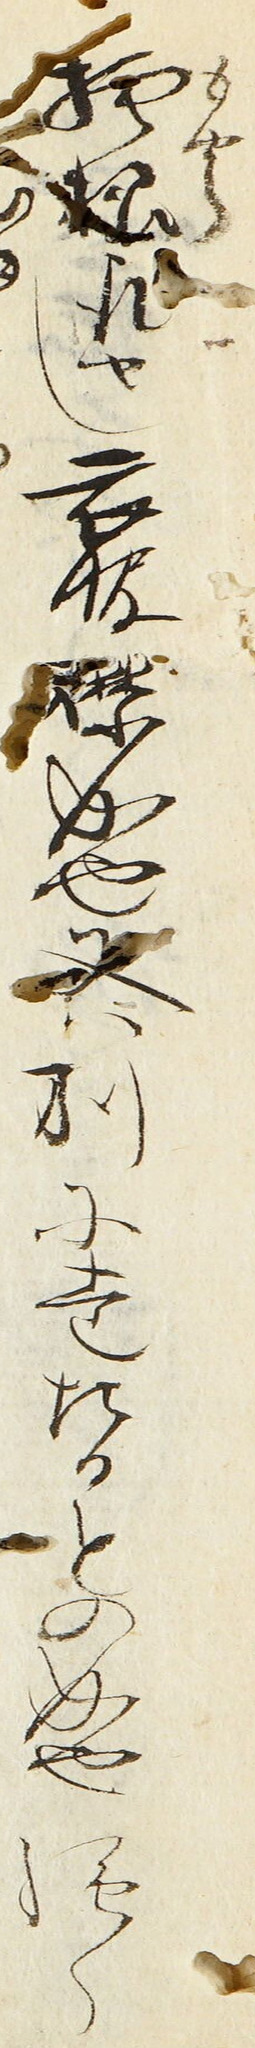模様取せし衣服襟成や又は別に巻たるもの也や強く
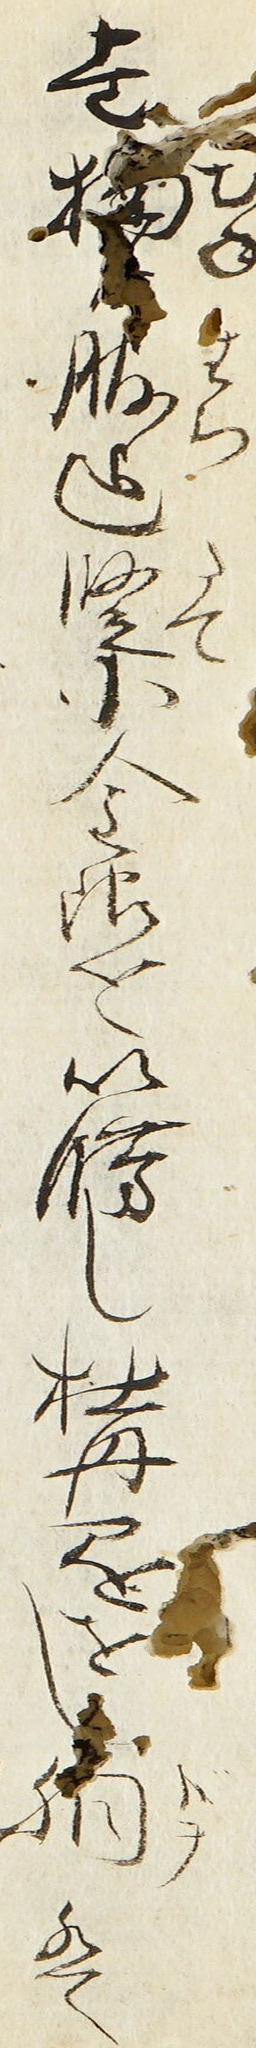巻胸より腹迄竪に金銀を以錺し牡丹懸をし胴は
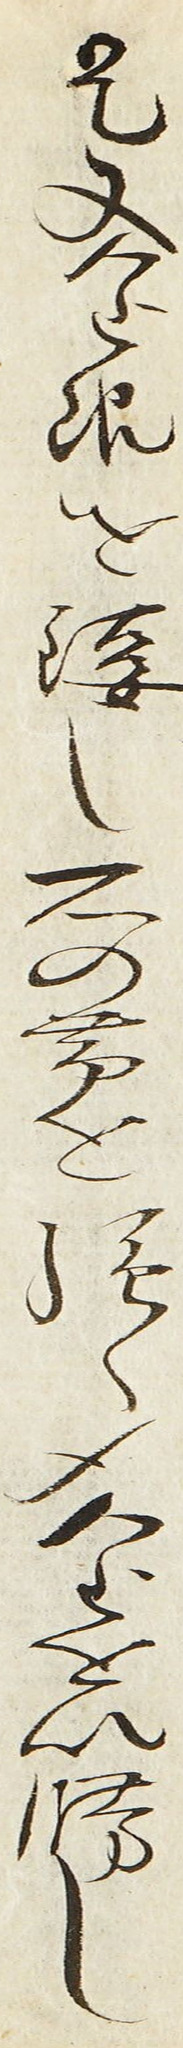是又金銀を鏤し石の帯を強く〆金を以錺し
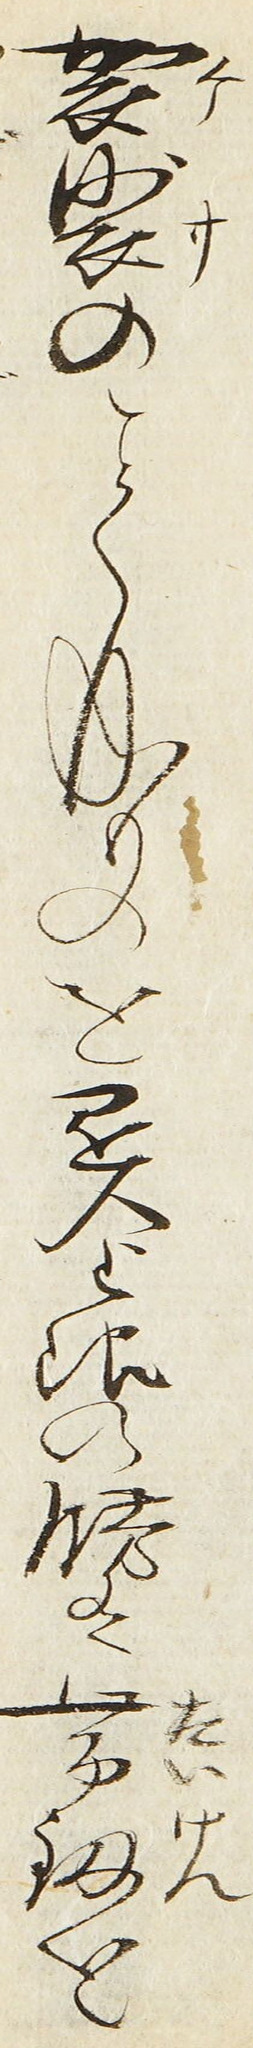袈裟のことく成ものを懸金銀の錺は帯釰を
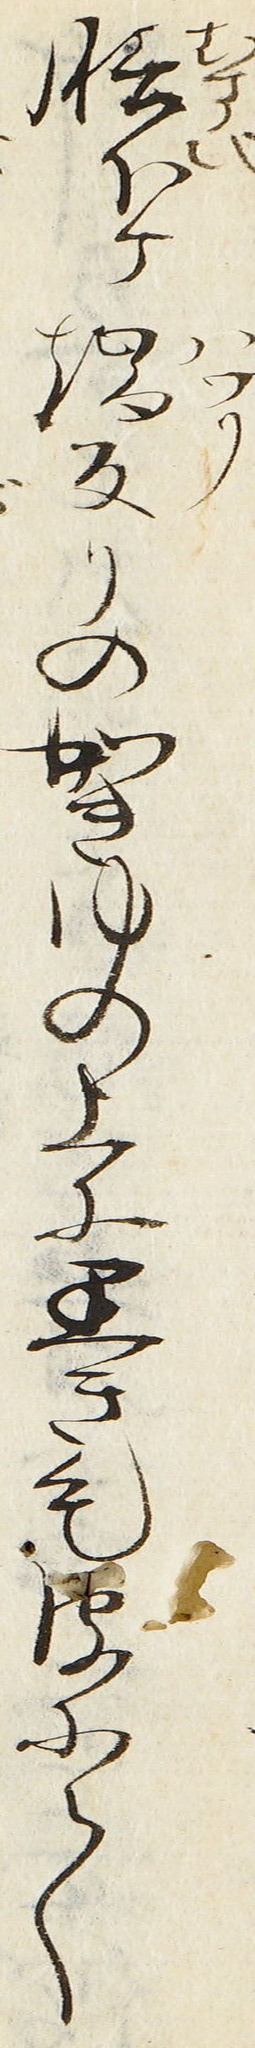結下け端反りの如き巾の上に黒き毛皮にて
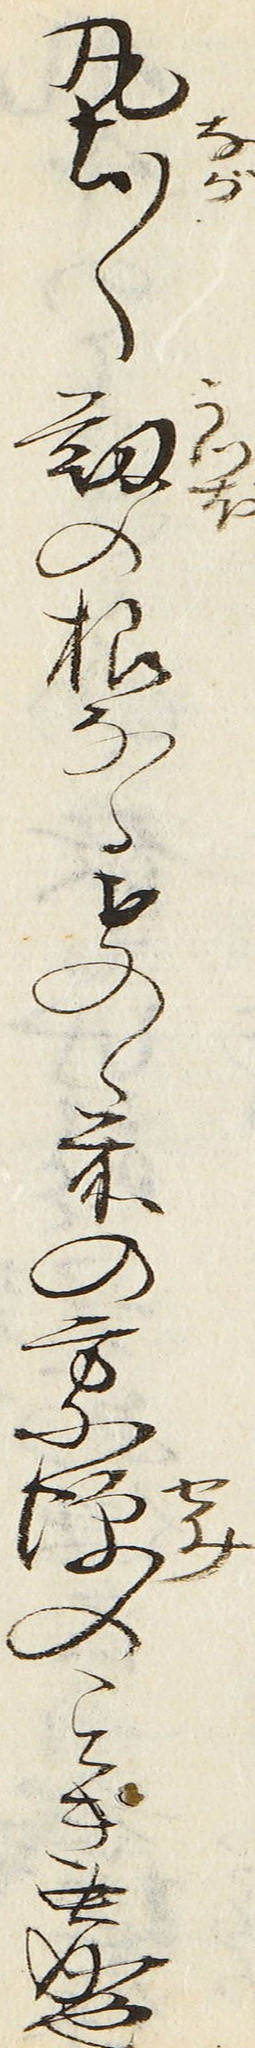丸長く靭の様なるものゝ前の方に蝉のことき虫成や
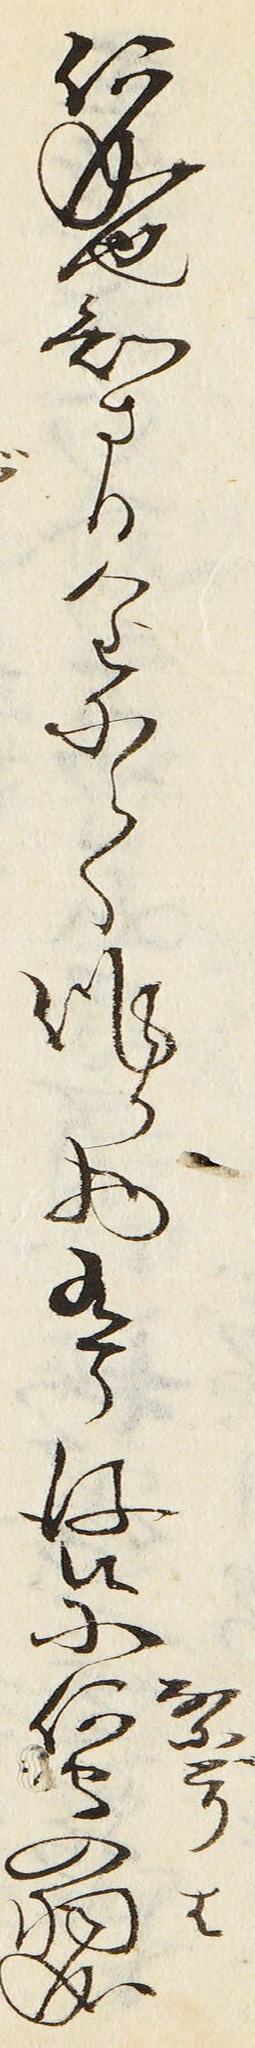何成や知さる金にて作り物有り後ロに何鳥の羽成
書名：魯西亜国舟渡来始末并日本流漂人異国遍歴之話（西洋欧羅巴州之内一）
